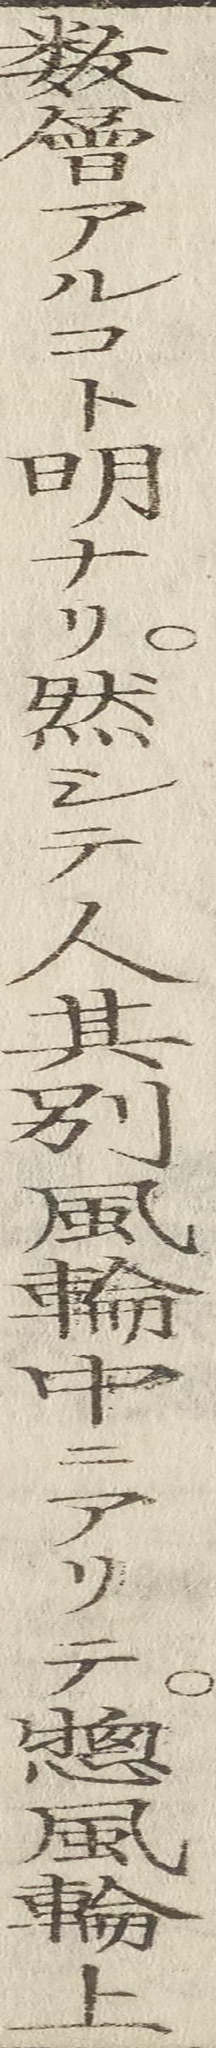数層アルコト明ナリ。然シテ人其別風輪中ニアリテ。惣風輪上
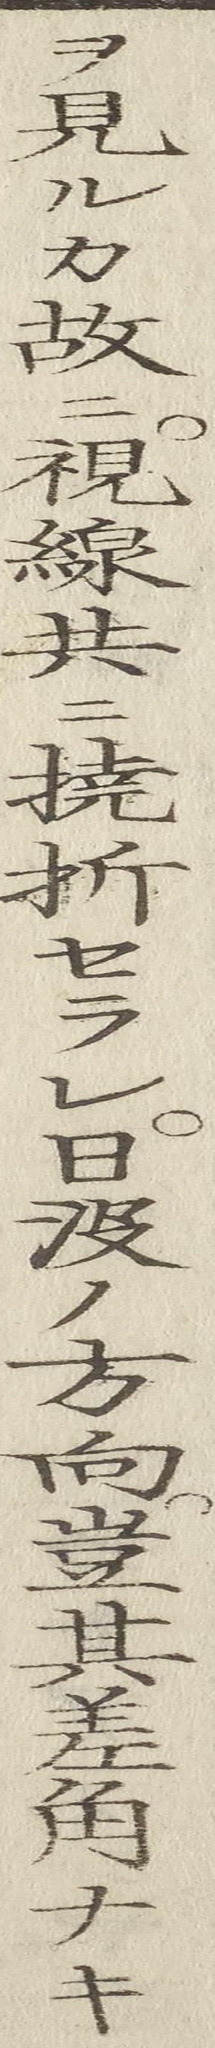ヲ見ルカ故ニ。視線共ニ撓折セラレ。日没ノ方向。豈其差角ナキ

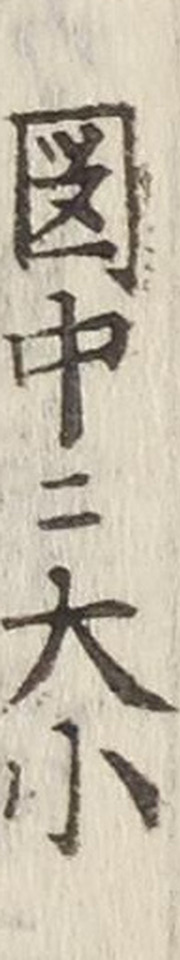図中ニ大小
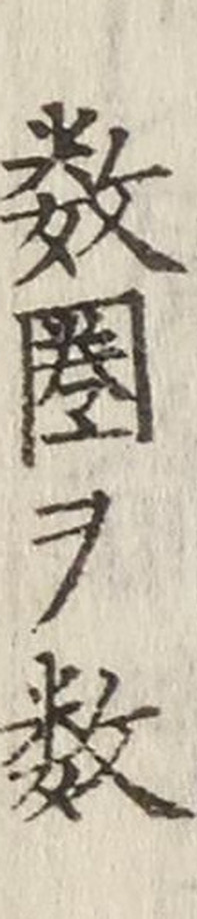数圏ヲ数
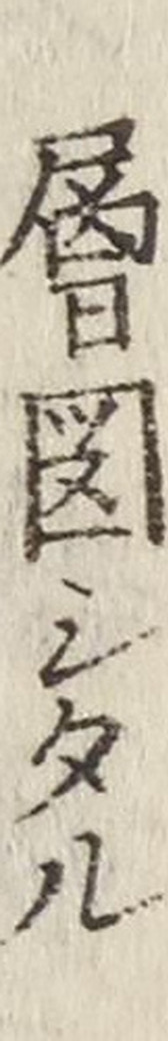層図シタル
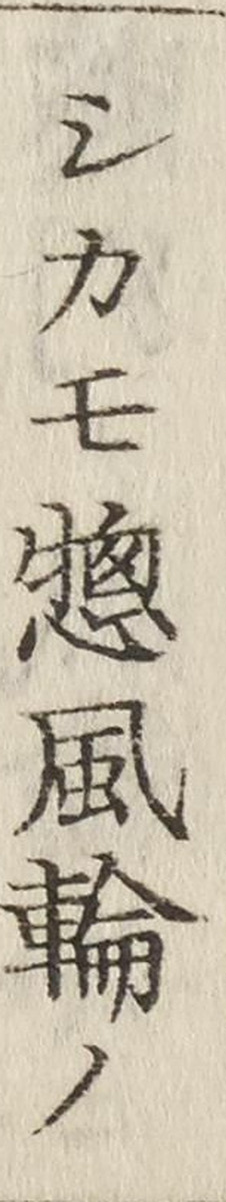シカモ惣風輪ノ
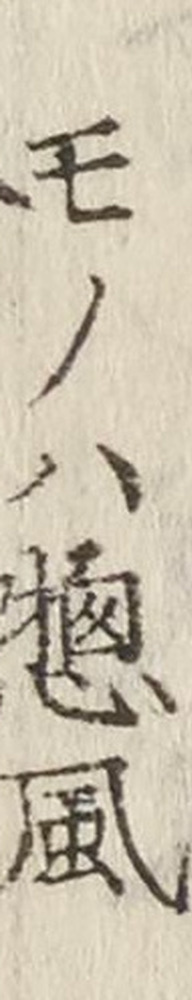モノハ惣風
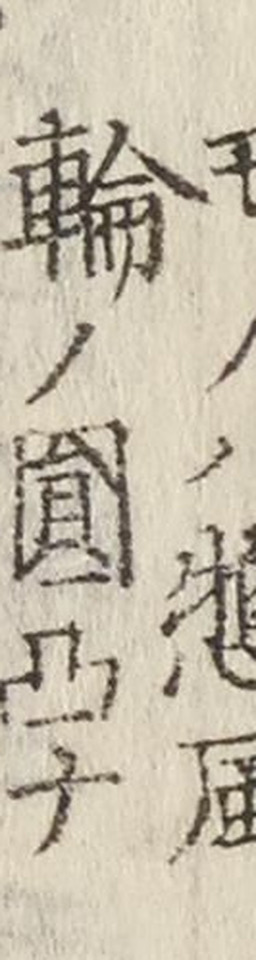輪ノ円凸ナ
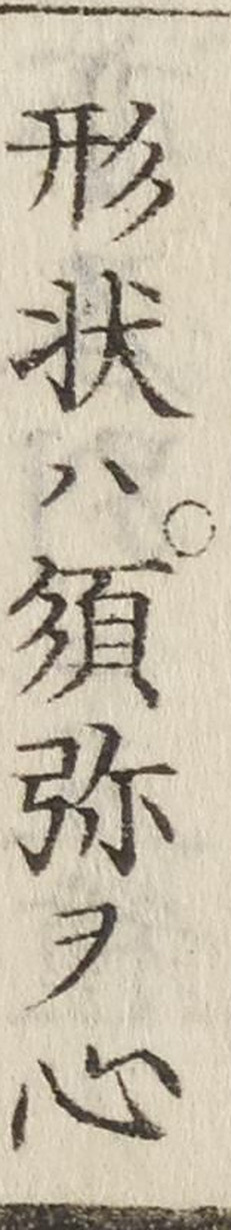形状ハ。須弥ヲ心
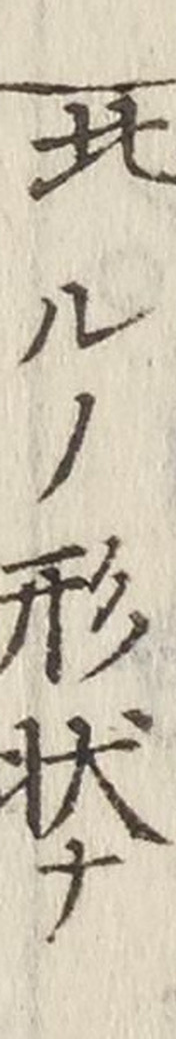ルノ形状ナ
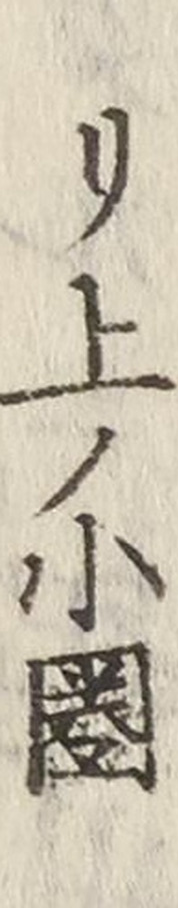リ上ノ小圏
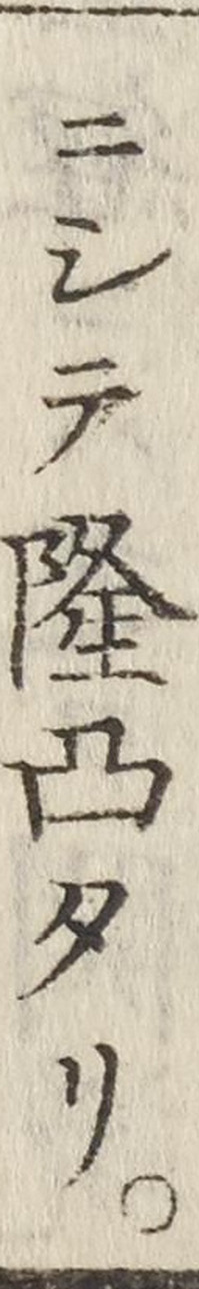ニシテ隆凸タリ。
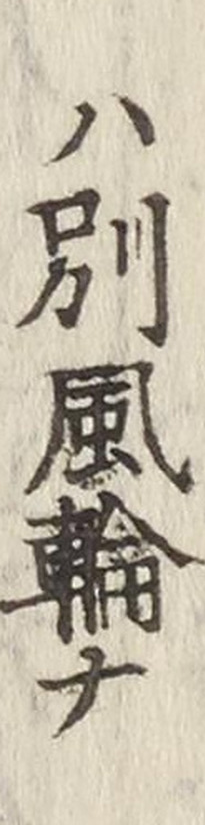ハ別風輪ナ
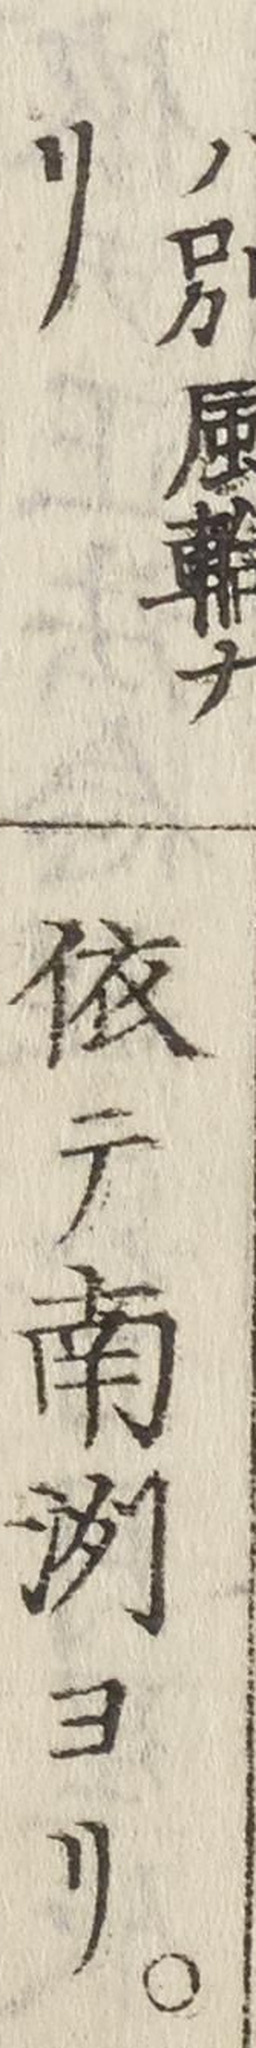依テ南洲ヨリ。
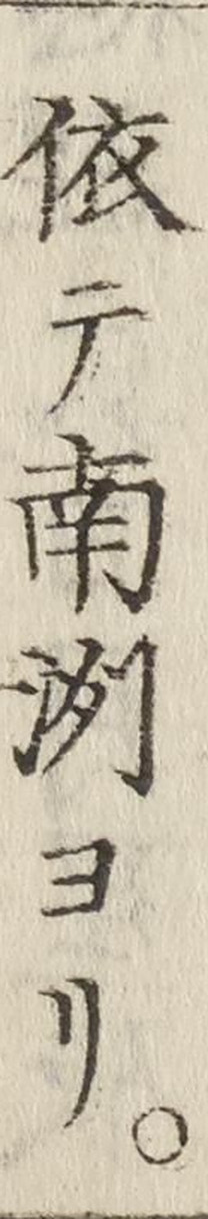依テ南洲ヨリ。
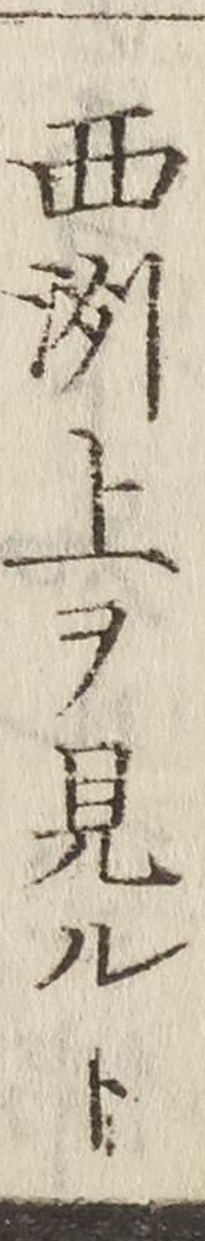西洲上ヲ見ルト
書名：護法新論　二編　上
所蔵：東京大学地震研究所図書室 Earthquake Research Institute Library, The University of Tokyo, JAPAN
